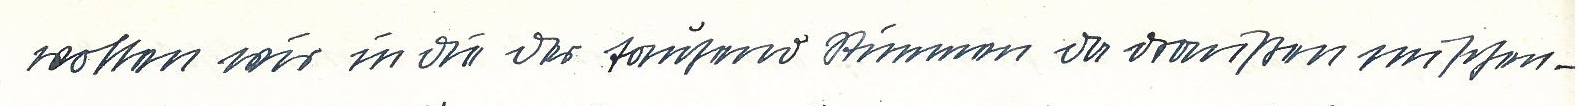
wollen wir in die der tausend Stimmen da draußen mischen –
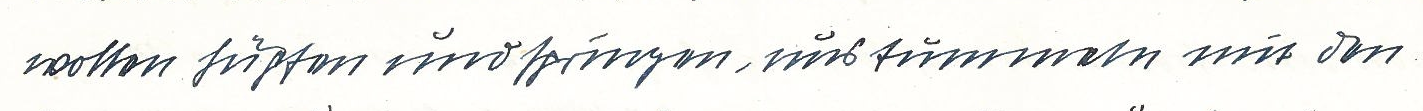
wollen hüpfen und springen, uns tummeln mit den
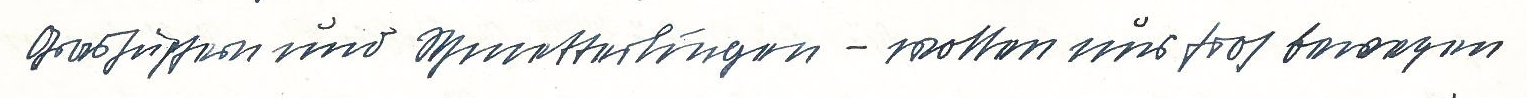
Grashupfern und Schmetterlingen – wollen uns froh bewegen
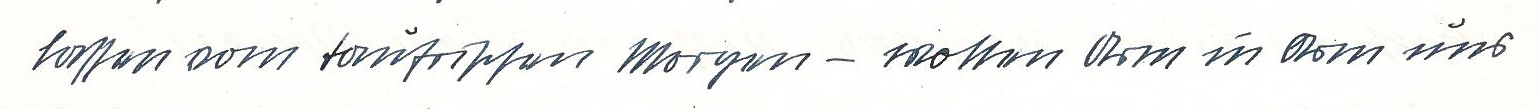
lassen vom taufrischen Morgen – wollen Arm in Arm uns
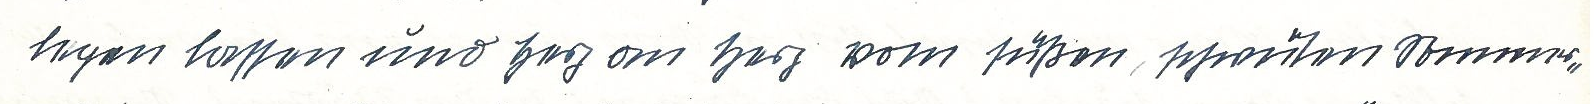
legen lassen und Herz an Herz vom süßen, schwülen Sommer¬
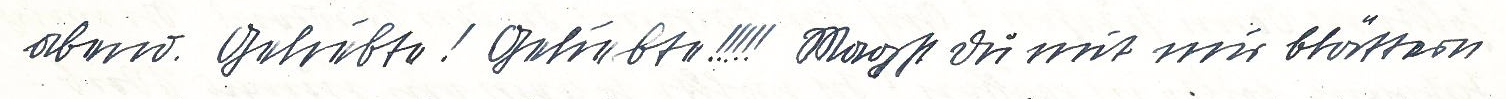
abend. Geliebte! Geliebte!!!!! Magst Du mit mir blättern
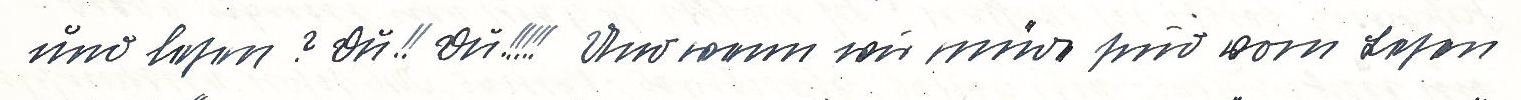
und lesen? Du!! Du!!!!! Und wenn wir müde sind vom Lesen
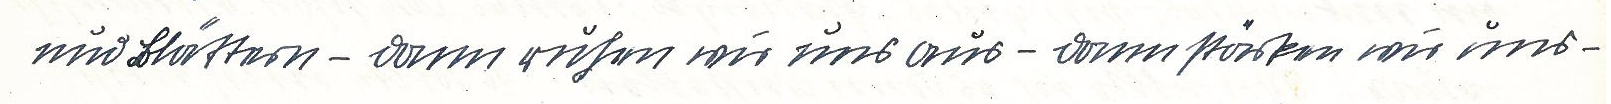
und Blättern – dann ruhen wir uns aus – dann stärken wir uns –
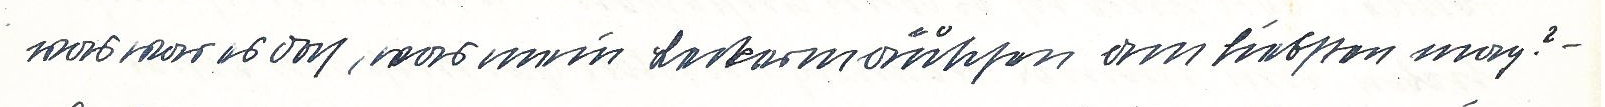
was war es doch, was mein Leckermäulchen am liebsten mag? –
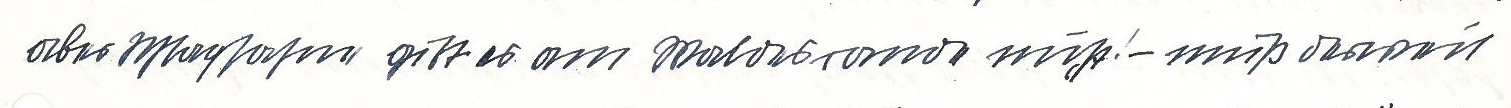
aber Schlagsahne gibt es am Waldrand nicht! – muß derweil
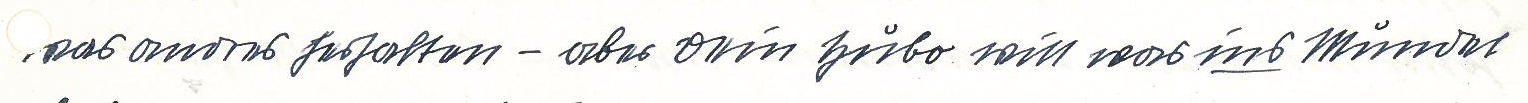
was andres herhalten – aber Dein Hubo will was ins Mundel
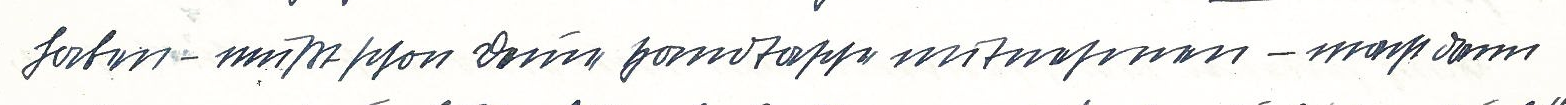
haben – mußt schon Deine Handtasche mitnehmen – macht dann
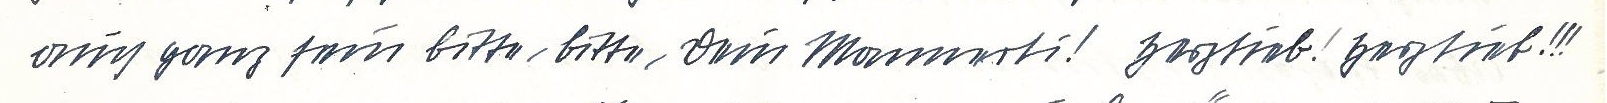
auch ganz fein bitte, bitte, Dein Mannerli! Herzlieb! Herzlieb!!!
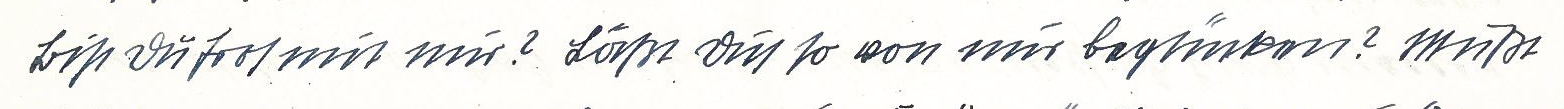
Bist Du froh mit mir? Läßt Dich so von mir beglücken? Mußt
